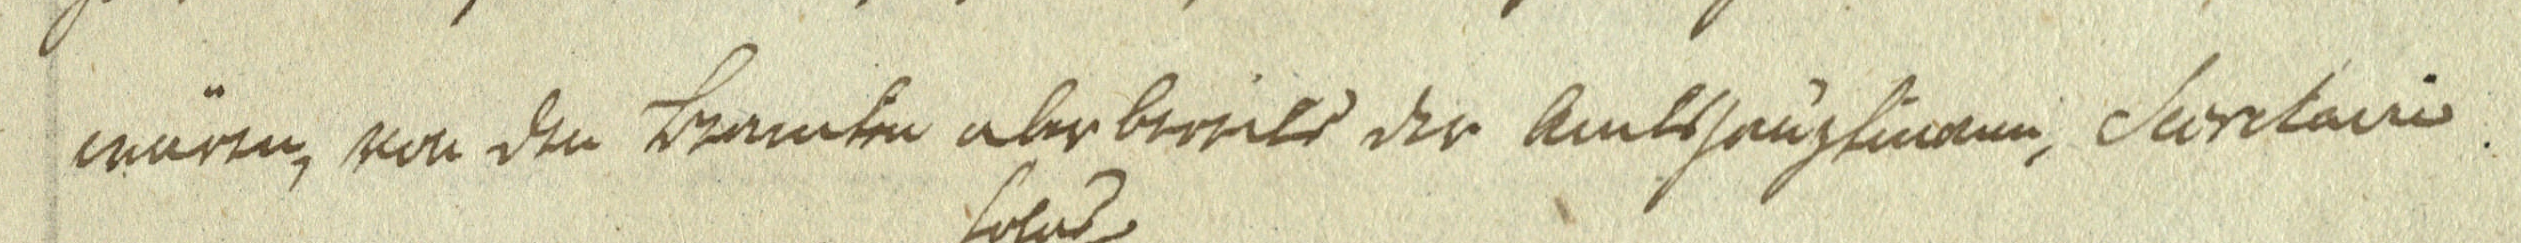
wären, von den Beamten aber bereits der Amtshauptmann, Secretair
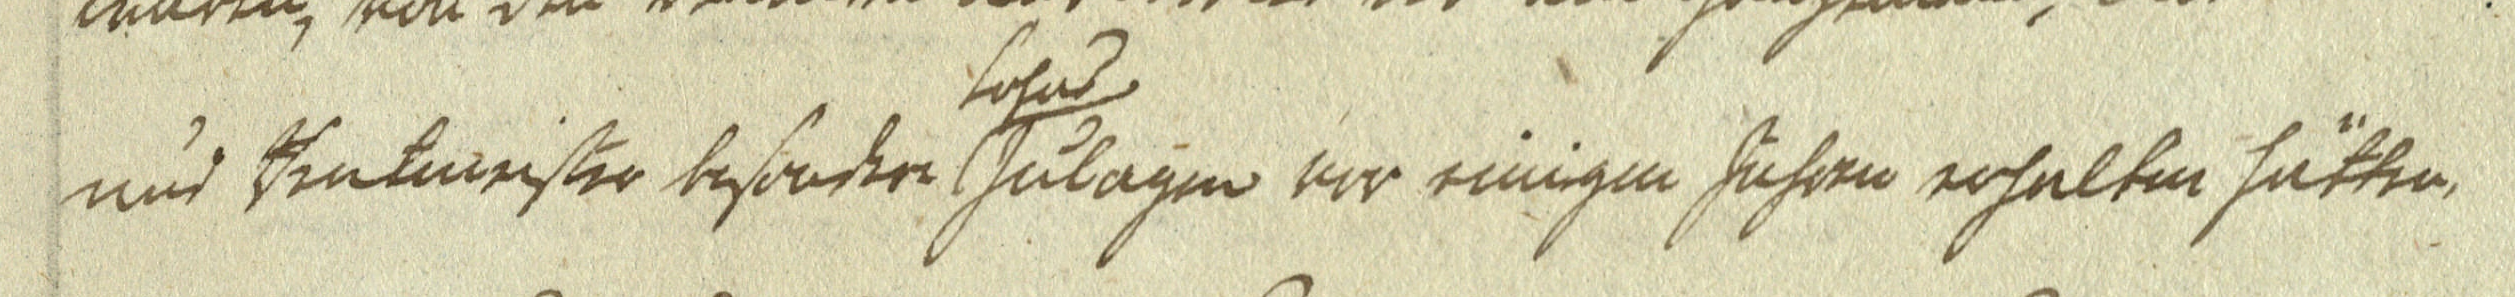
und Rentmeister besondere Lohnszulagen vor einigen Jahren erhalten hätten,
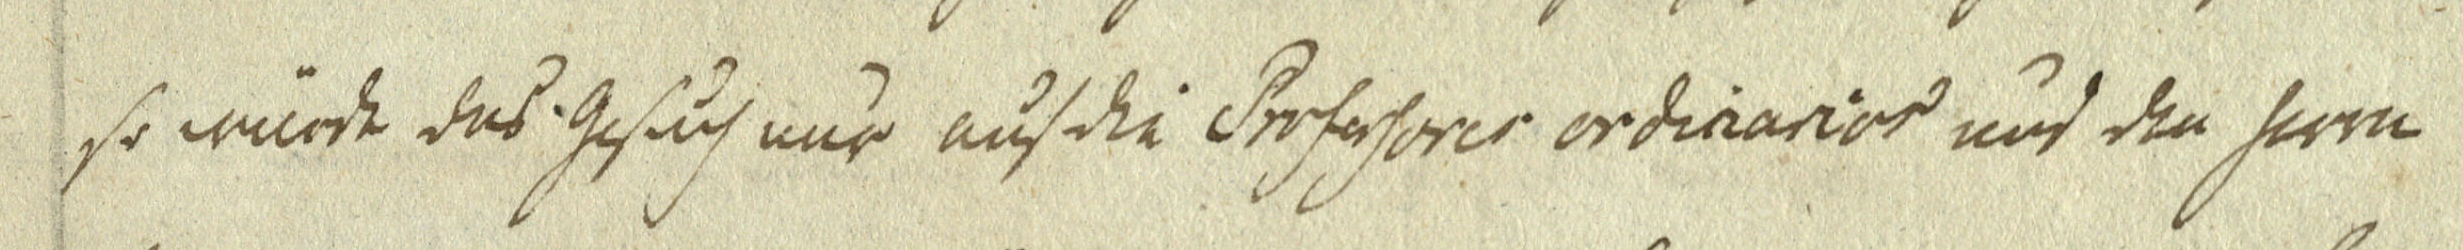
so würde das Gesuch nur auf die Professores ordinarios und den Herrn
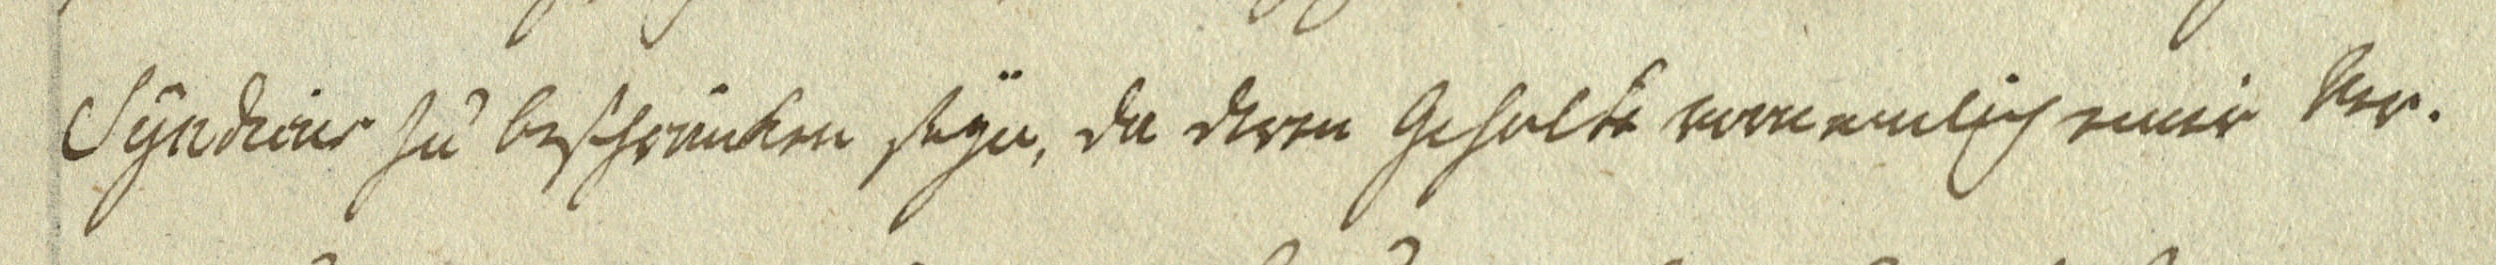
Sÿndicus zu beschräncken seÿn, da deren Gehalte vornemlich einer Ver¬
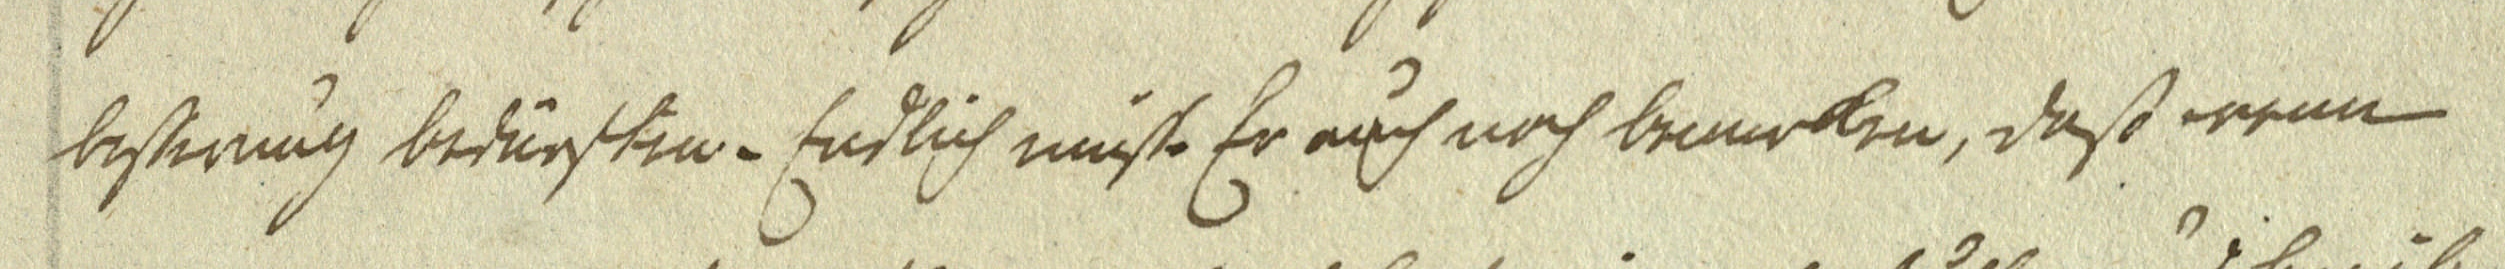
besserung bedürften. Endlich müsse Er auch noch bemerken, daß wenn
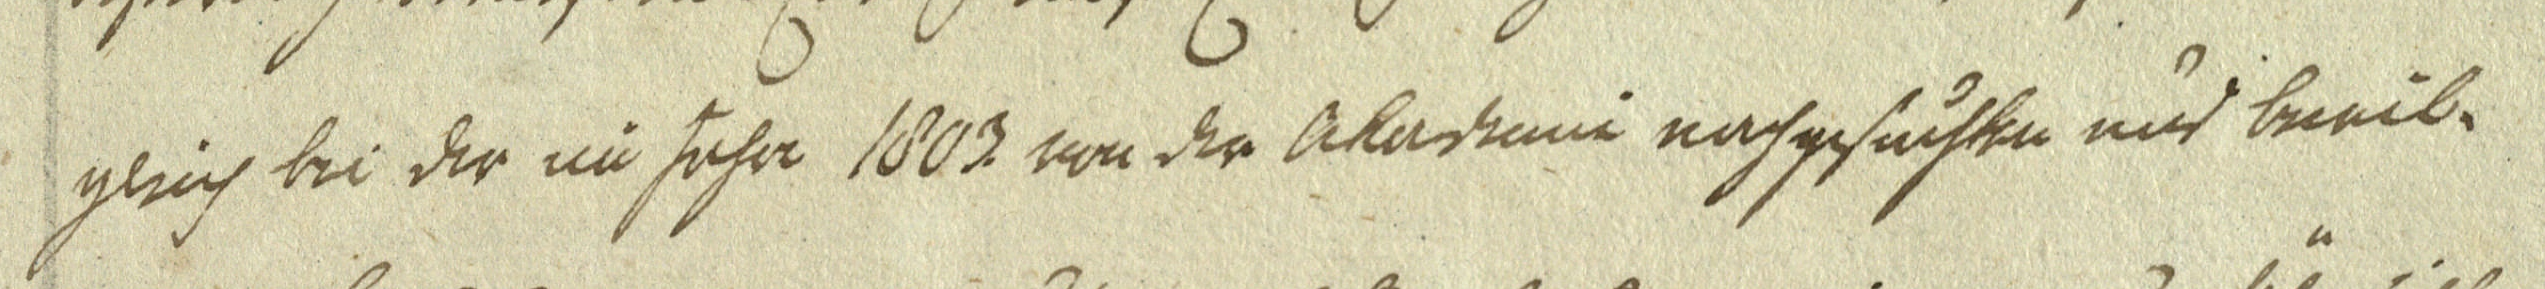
gleich bei der in Jahre 1803. von der Akademie nachgesuchten und bewil¬
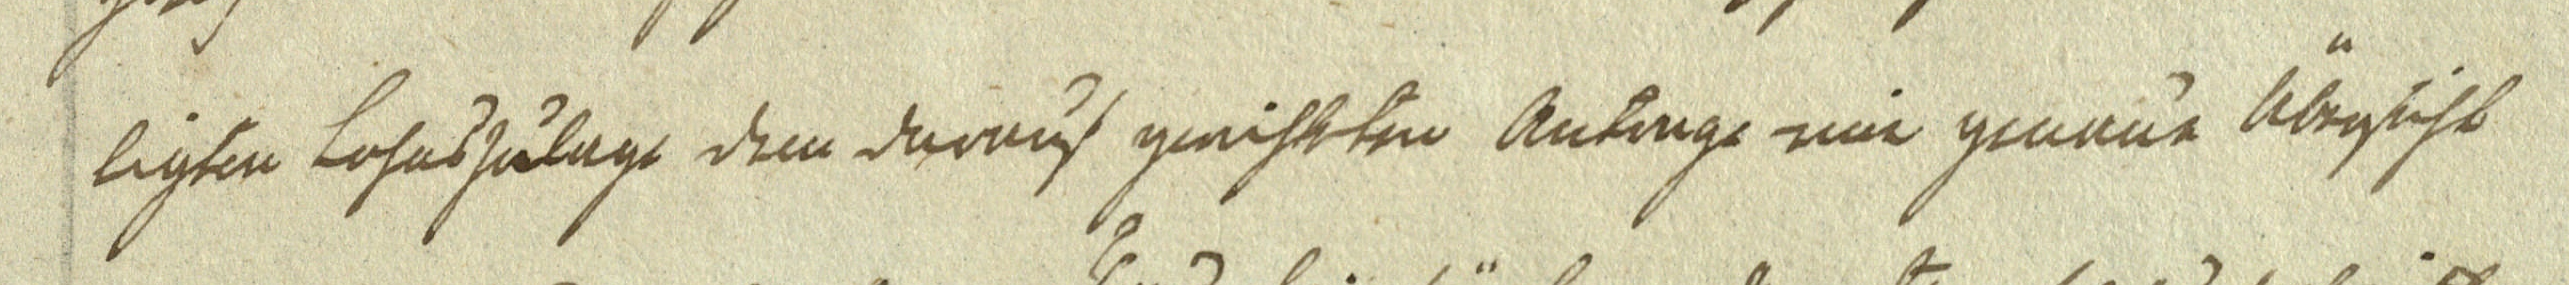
ligten Lohnszulage dem darauf gerichteten Antrage eine genaue Übersicht
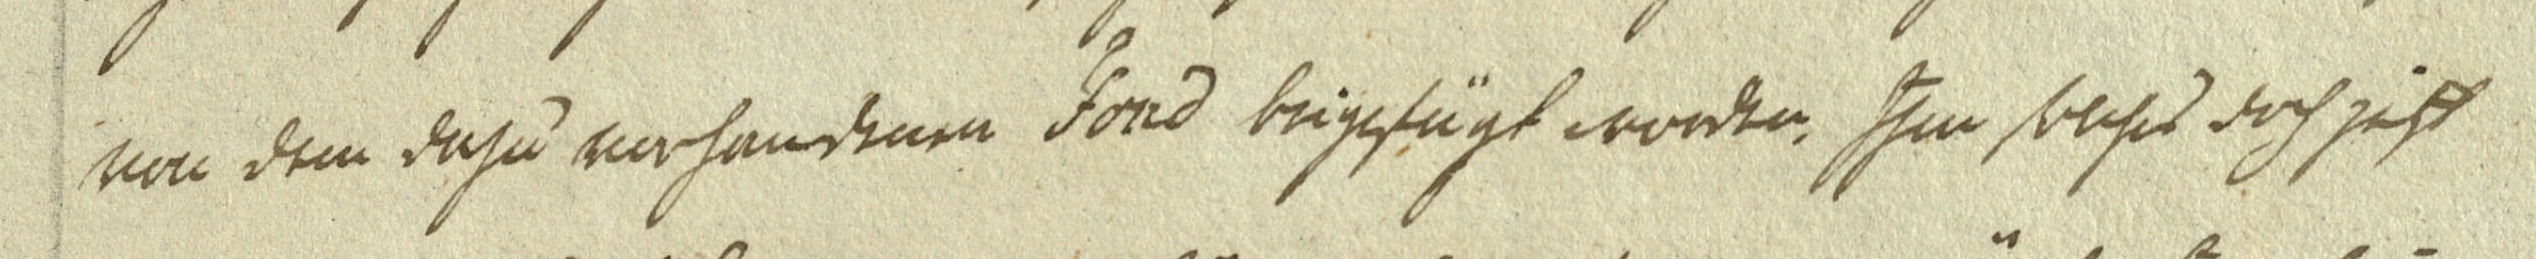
von dem dazu vorhandenen Fond beigefügt worden. Ihm solches doch jetzt
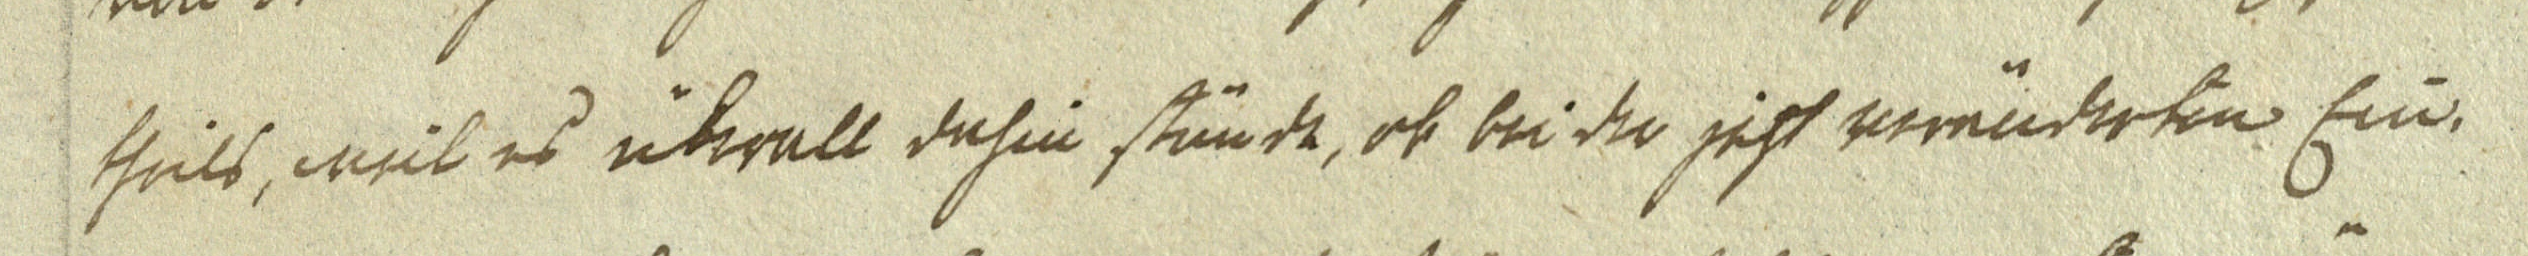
theils, weil es überall dahin stünde, ob bei der jetzt veränderten Ein¬
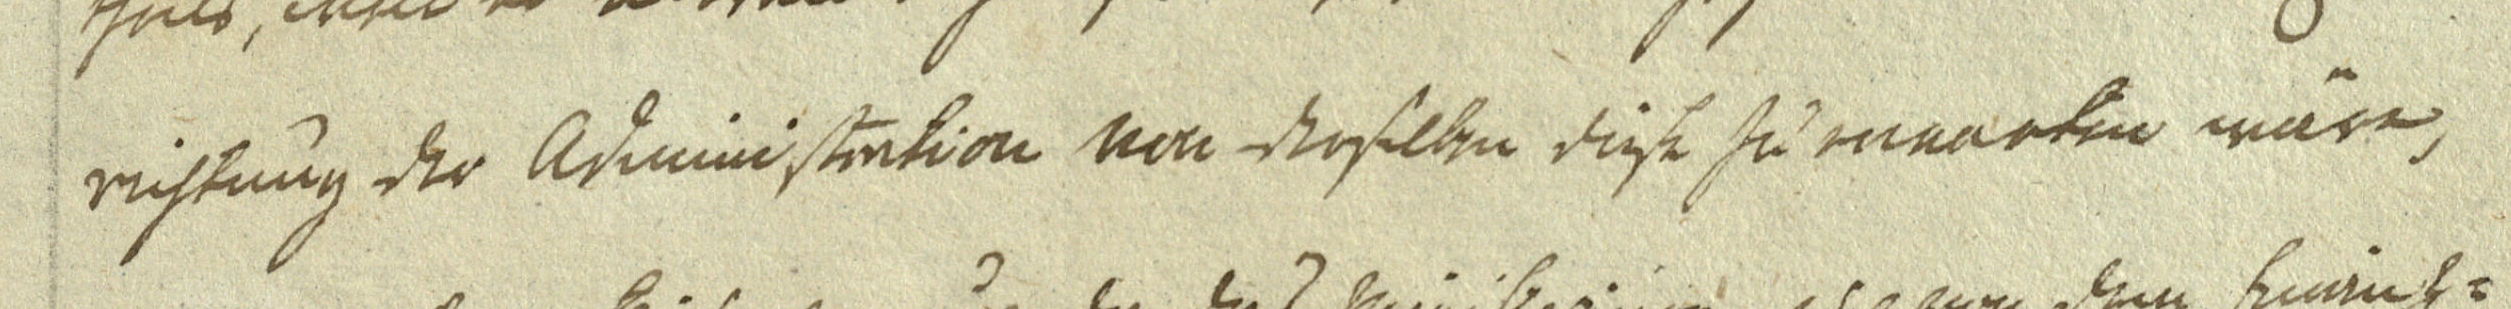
richtung der Administration von derselben diese zu erwarten wäre,
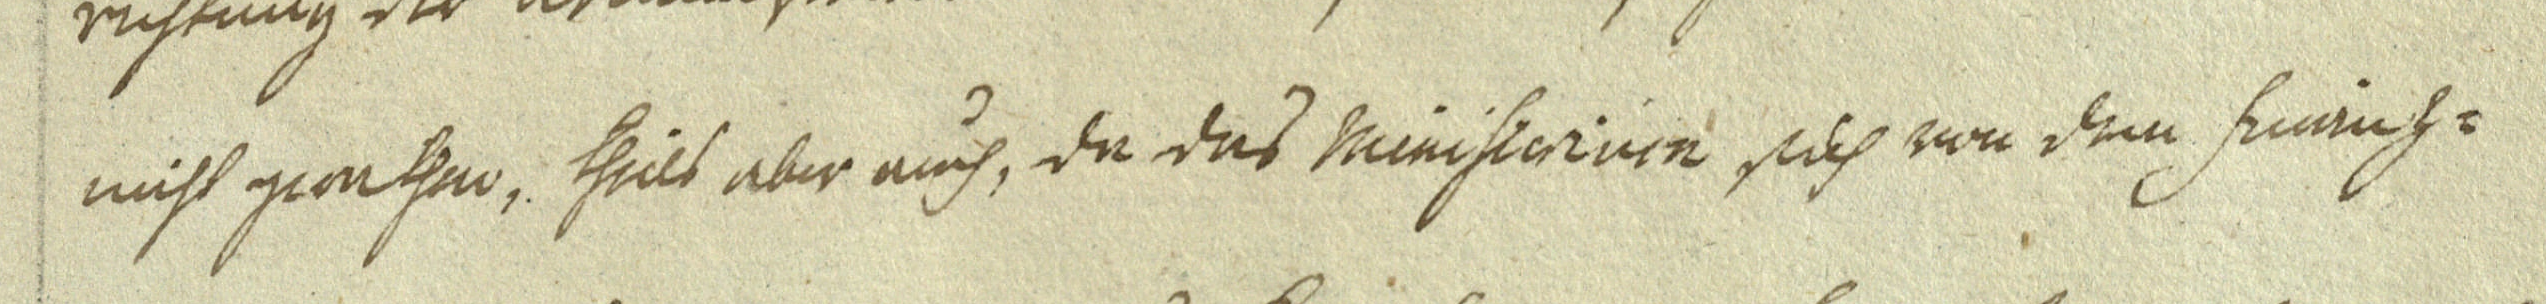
nicht gerathen, theils aber auch, da das Ministerium sich von dem Finanz¬
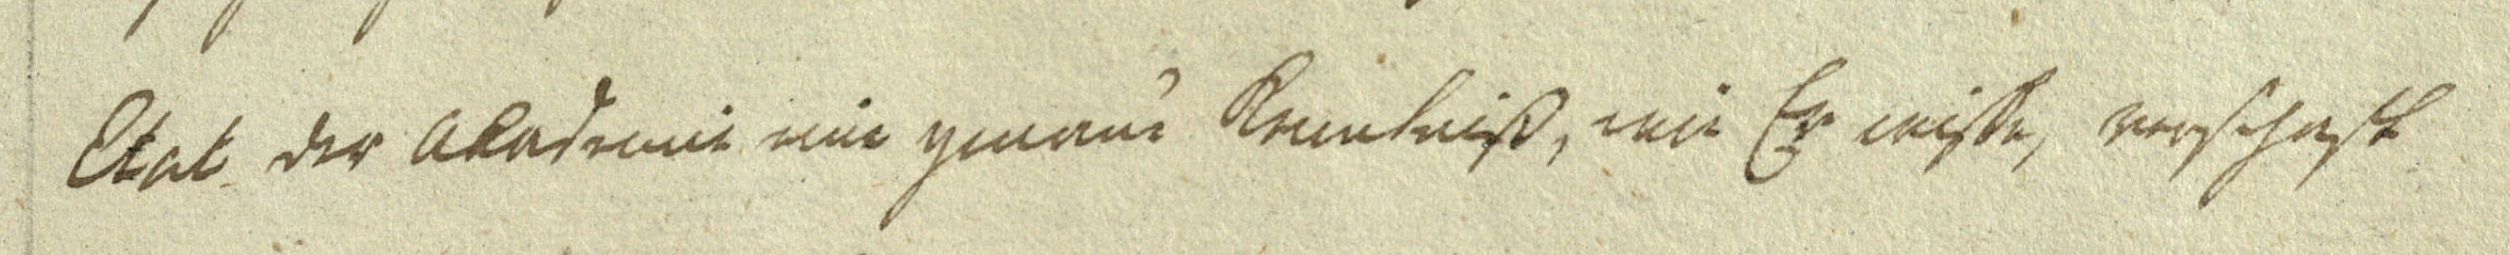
Etat der Akademie eine genaue Kenntniß, wie Er wisse, verschaft
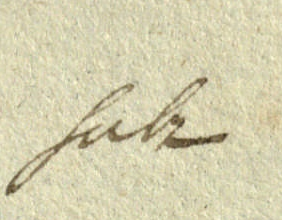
habe
